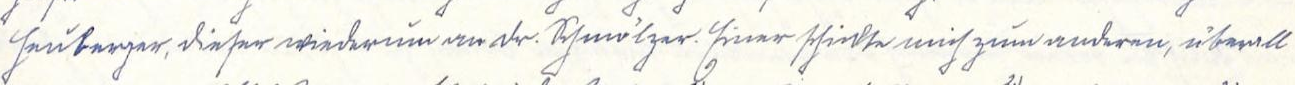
Heuberger, dieser wiederum an Dr. Schmölzer. Einer schickte mich zum anderen, überall
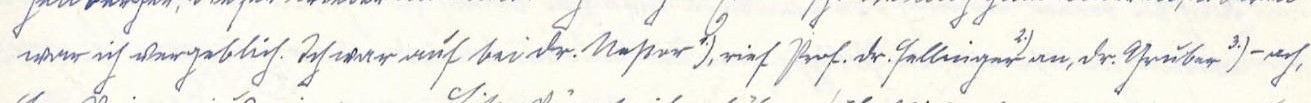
war ich vergeblich. Ich war auch bei Dr. Nestor 1), rief Prof. Dr. Fellinger 2) ans, auch Dr. Gruber 3)- ach,
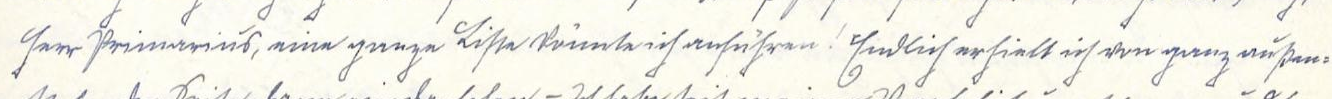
Herr Primarius, eine ganze Liste könnte ich anführen. Endlich erhielt ich von ganz außen.
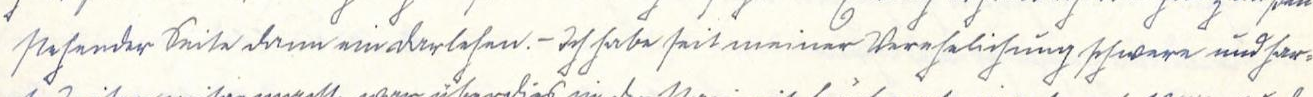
stehende Seite dann ein Darlehen.- Ich habe seit meiner Verehelichung schwere und haret
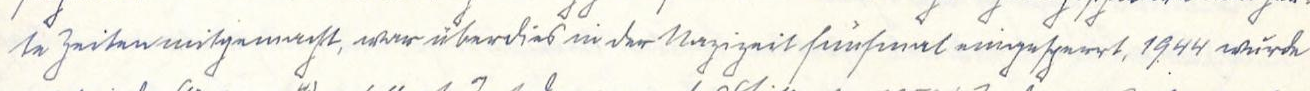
te Zeiten mitgemacht, war überdies in der Nazizeit fünfmal einngesperrt, 1944 wurde
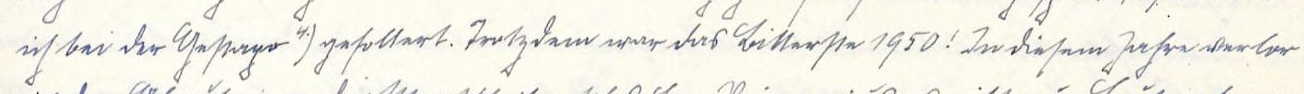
ich bei der Gestapo 4) gefoltert. Trotzdem war das Bitterste 1950! In diesem Jahre verlor
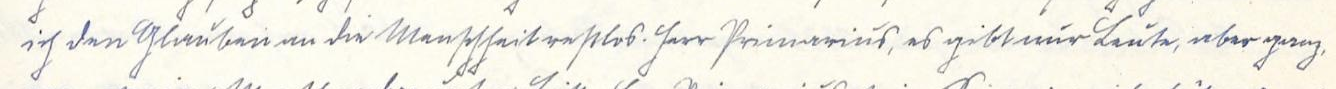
ich den Glauben an die Menscheit restlos. Herr Primarius, es gibt nur Leute, aber ganz,
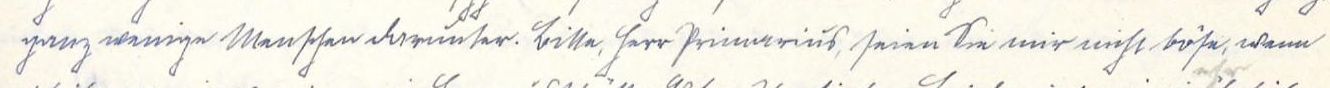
ganz wenige Menschen darunter. Bitte, Herr Primarius, seien Sie mir nicht böse, wenn
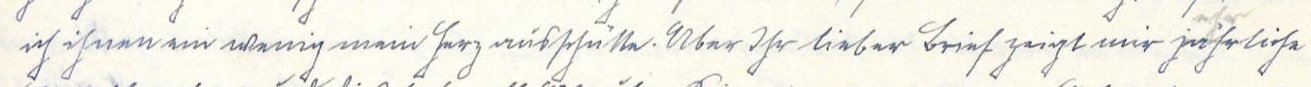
ich Ihnen ein wenig mein Herz ausschütte. Aber Ihr lieber Brief zeigt mir jährliche
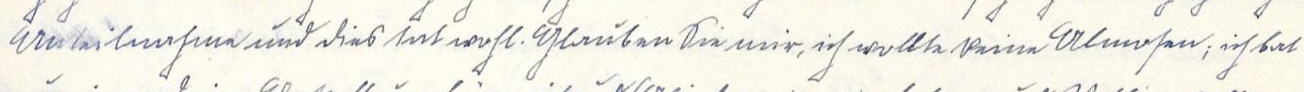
Anteilnahme und dies tut wohl. Glauben Sie mir, ich wollte keine Almosen; ich bat
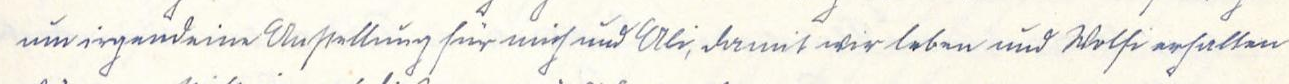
um irgendeine Anstellung für mich und Ali, damit wir leben und Wolfi erhalten
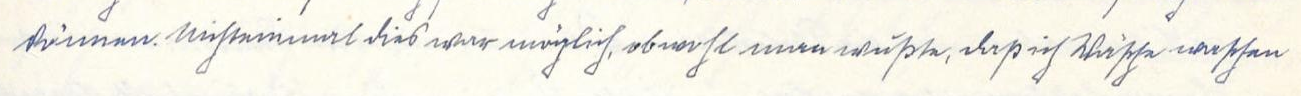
können. Nichteinmal dies war möglich, obwohl man wusste, dass ich Wäsche waschen
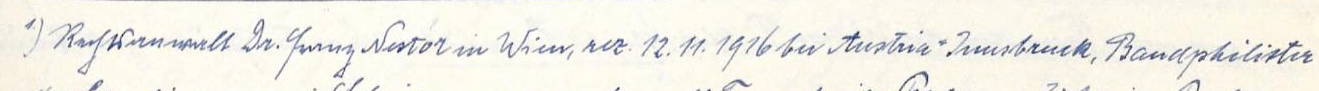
1) Rechtsanwalt Dr. Franz Nestor in Wien, rez. 12. 11. 1916 bei Austria- Innsbruck, Bandphilister
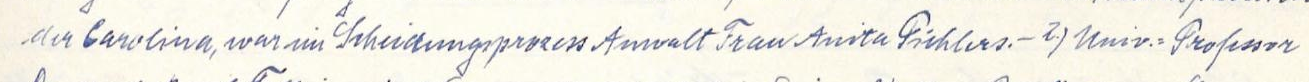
der Carolina, war im Scheidungsprozess Anwalt Frau Anita Pichlers.- 2) Univ. Professor
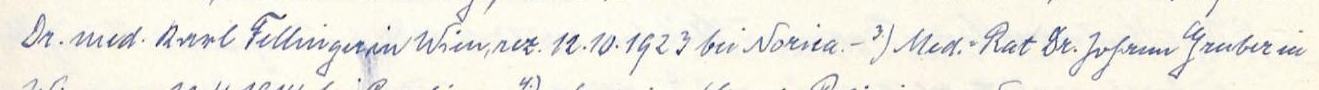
Dr. med. Karl Fellinger in Wien, rez. 12.10. 1923 bei Norica. 3) Med.- Rat Dr. Johann Gruber in
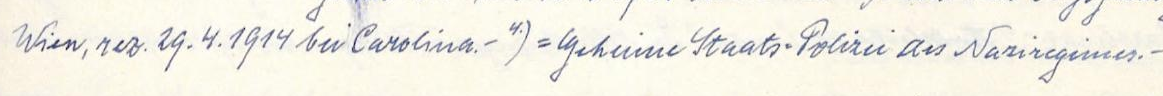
Wien, rez. 29. 4. 1914 bei Carolina.- 4) Geheime Staatspolizei des Naziregimes.
